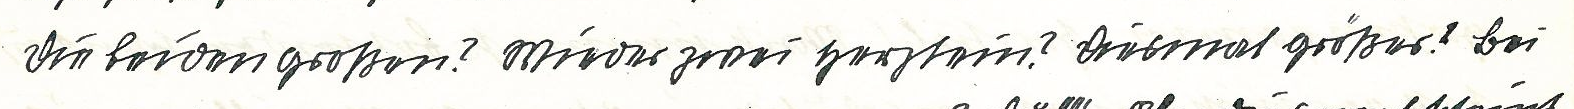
die beiden großen? Wieder zwei Herzlein? Diesmal größer! Bei
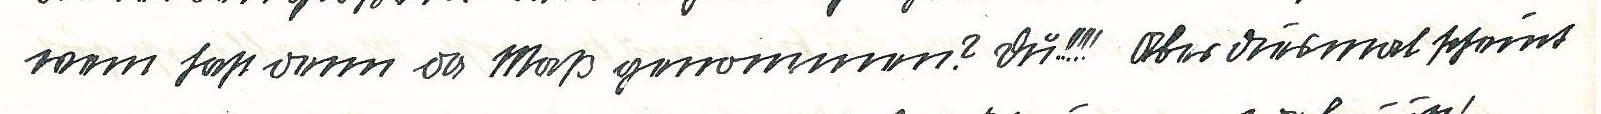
wem hast denn da Maß genommen? Du!!!!! Aber diesmal scheint
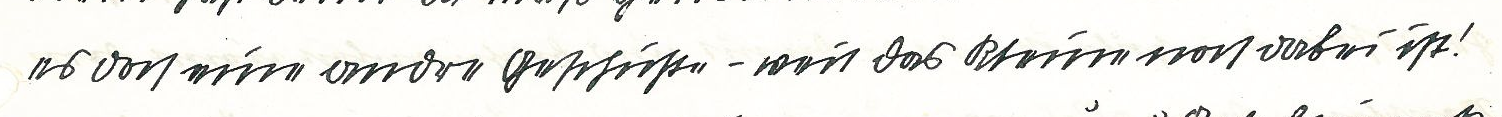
es doch eine andre Geschichte – weil das kleine noch dabei ist!
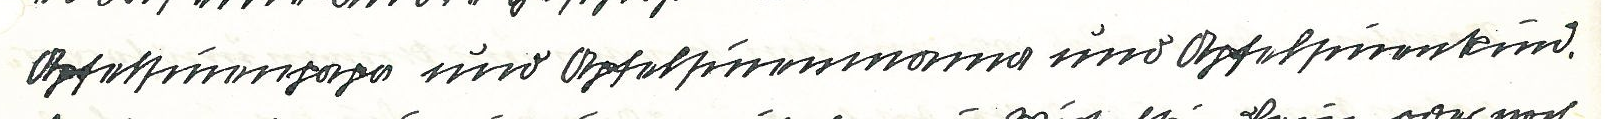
Apfelsinenpapa und Apfelsinenmama und Apfelsinenkind.
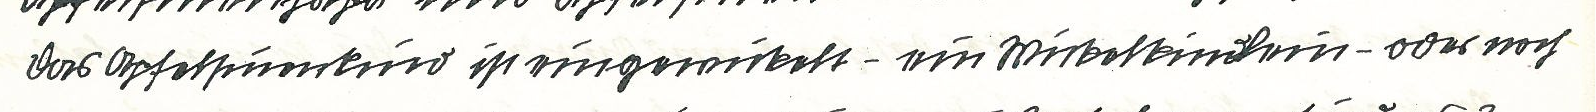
Das Apfelsinenkind ist eingewickelt – ein Wickelkindlein – oder noch
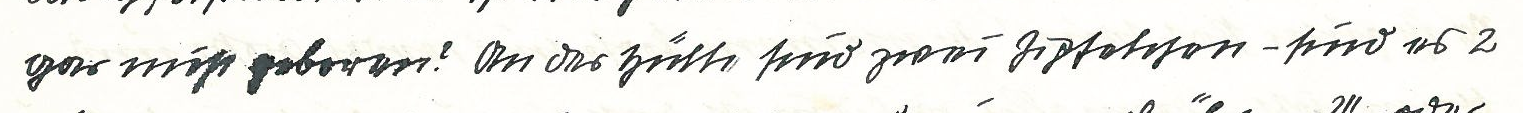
gar nicht geboren? An der Hülle sind zwei Zipfelchen – sind es 2
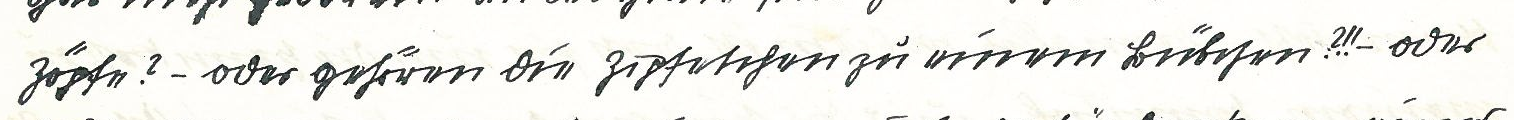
Zöpfe? – oder gehören die Zipfelchen zu unserm Bübchen?!! – oder
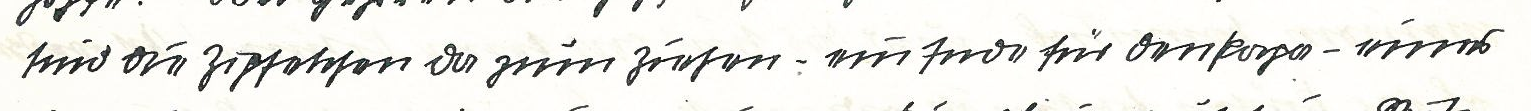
sind die Zipfelchen da zum ziehen – ein Ende für den Papa – eines
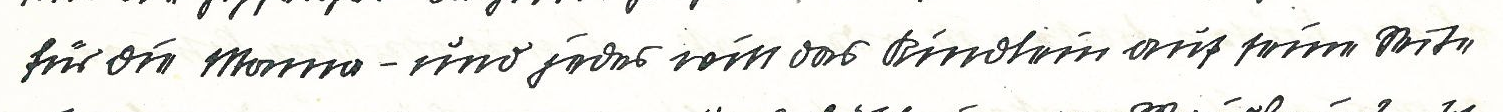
für die Mama – und jedes will das Kindlein auf seine Seite
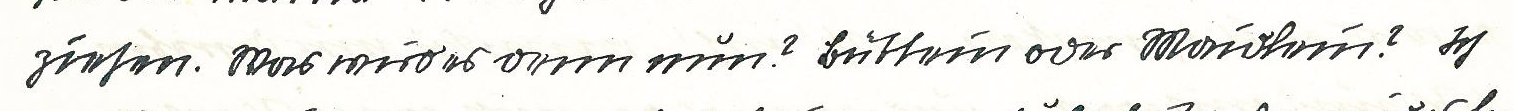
ziehen. Was wird es denn nun? Büblein oder Maidlein? Ich
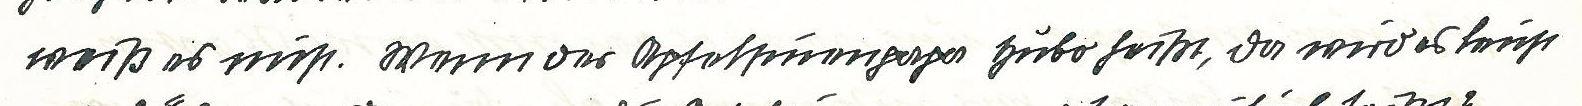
weiß es nicht. Wenn der Apfelsinenpapa Hubo heißt, da wird es leicht
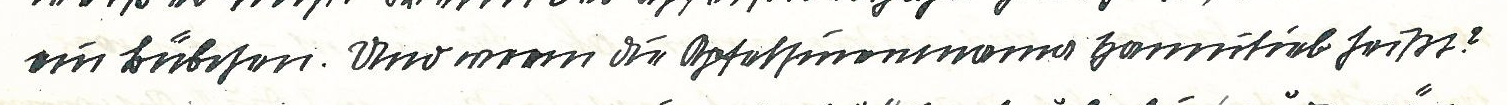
ein Bübchen. Und wenn die Apfelsinenmama lieb heißt?
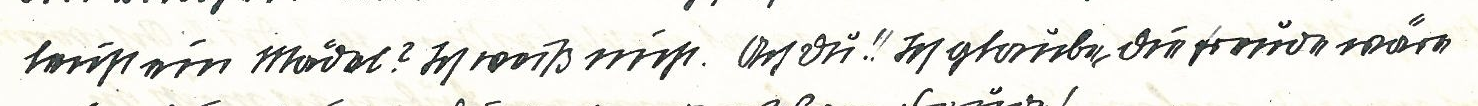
leicht ein Mädel? Ich weiß nicht. Ach Du!! Ich glaube, die Freude wäre
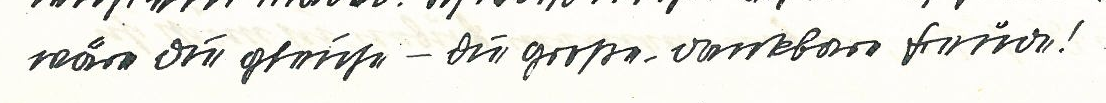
wäre die gleiche – die große, dankbare Freude!
